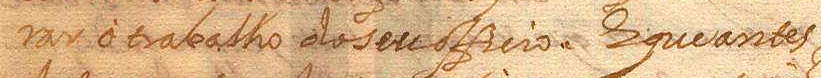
rar o trabalho do seu officio. E que antes
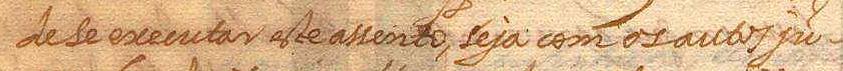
de se executar este assento, seja com os autos jū
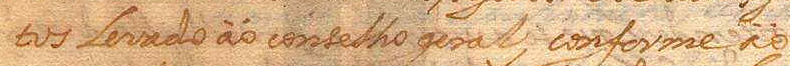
tos levado ao conselho geral, conforme ao
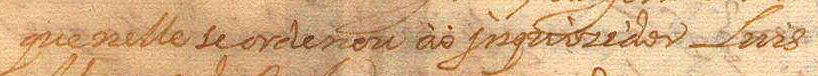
que nelle se ordenou ao jnquizidor Luis
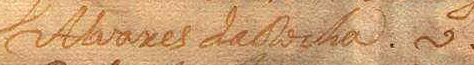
Alvares da Rocha.
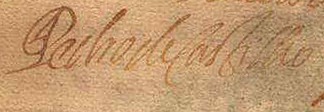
Pedro de Castilho
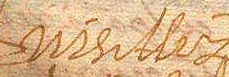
Luis Alvz̄
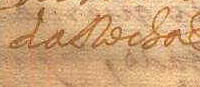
da Rocha
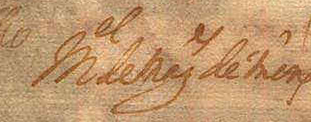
Mel de Mages de Mens
